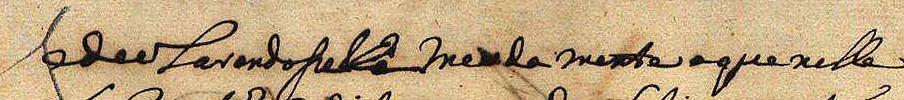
e declarandosselhe meudamente o que nelle
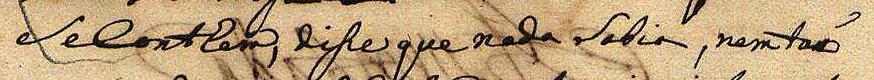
Se Conthem, disse que nada Sabia, nem taõ
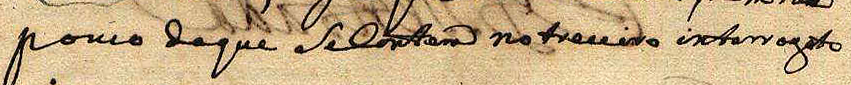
pouco do que se Contem no treceiro interrogato
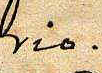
rio.
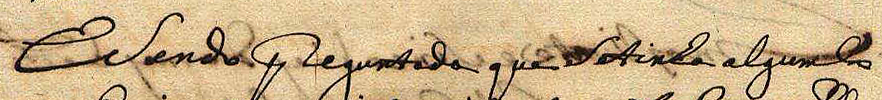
E Sendo pReguntada que se tinha algum Co
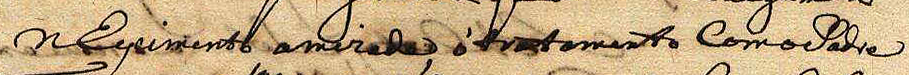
nhescimento, amizade, ó tratamento Com o Padre
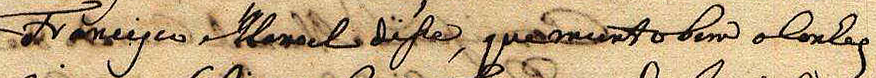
Francisco Manoel disse, que munto bem o Conhes
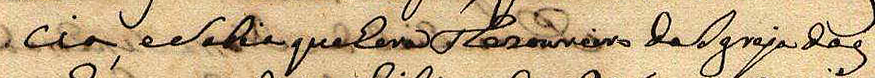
cia, e sabia que hera Thezoureiro da Igreja das
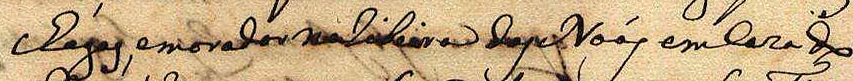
chagas, e morador na Ribeira das Naós em Caza do
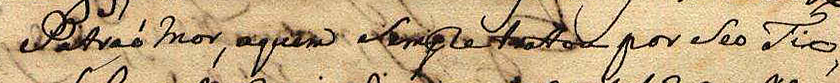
Patraõ mor, a quem sempre tratou por seo Tio,
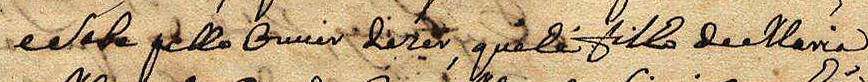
e sabe pello Ouuir dizer, que hé filho de Maria
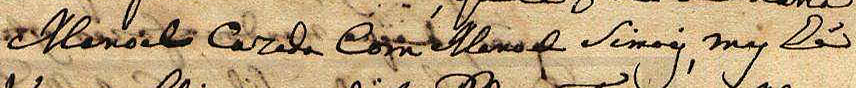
Manoel Cazada Com Manoel Simois, mas hé
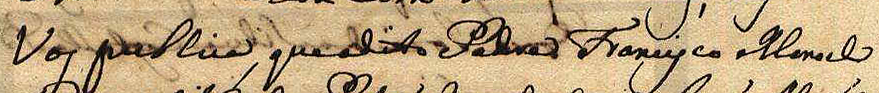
Vos publica, que o dito Padre Francisco Manoel
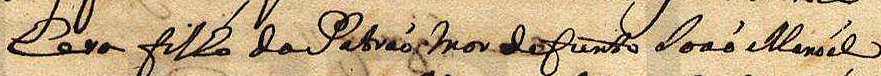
hera filho do Patraõ mor defunto Ioaõ Manoel
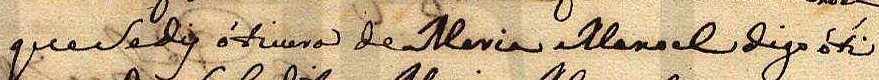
que se dis ó tiuera de Maria Manoel digo ó ti
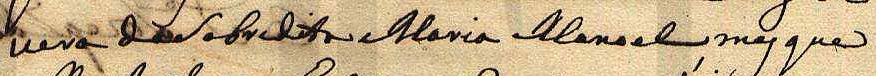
uera da Sobredita Maria Manoel, mas que
